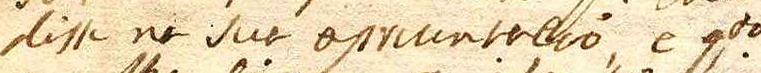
disse na sua aprezentaçaõ, e q.to
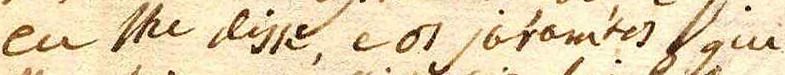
eu lhe disse, e os juram.tos que
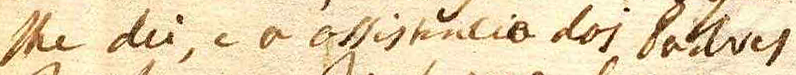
lhe dei, e a assistencia dos Padres
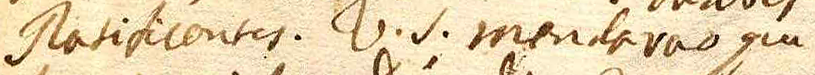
Ratificantes. V. S. mandara o que
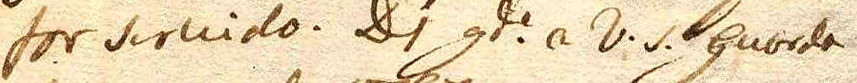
for seruido. Ds̄ gd.e a V. s. Guarda
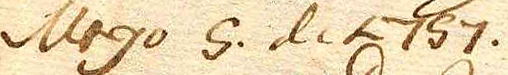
Mayo 5. de 1757.
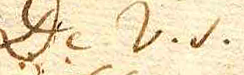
De V. s.
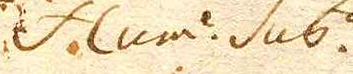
Hum.e sub.o
